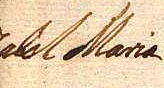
__abel Maria
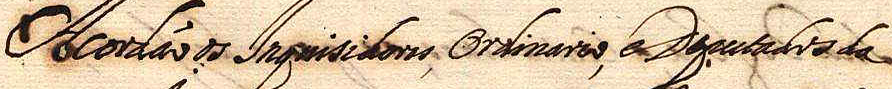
Acordaõ os Inquisidores, Ordinario, e Deputados da
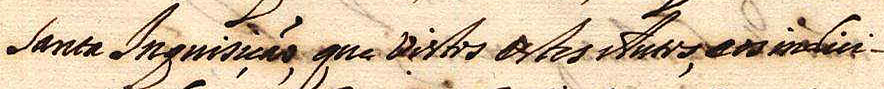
santa Inquisiçaõ, que vistos estes Autos, e os indici
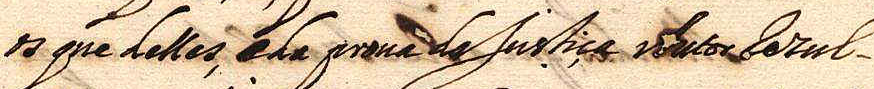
os que delles, e da proua da Justiça Autor Rezul
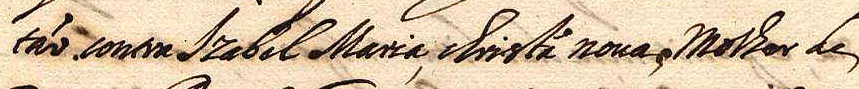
taõ contra Izabel Maria, christã noua, Molher de
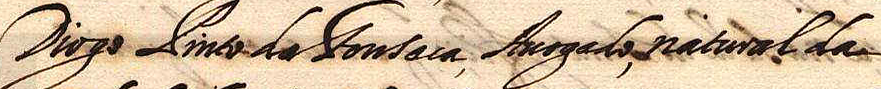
Diogo Pinto da Fonseca, Auogado, natural da
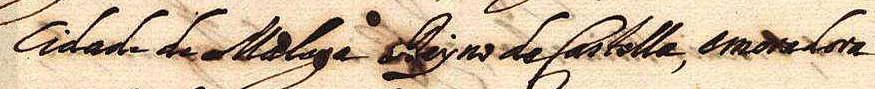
Cidade de Malaga Reyno de Castella, e moradora
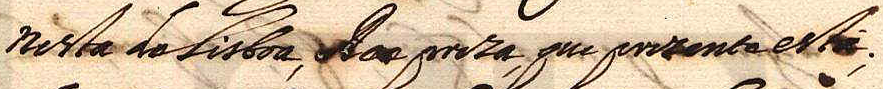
nesta de Lisboa, Ree preza, que prezente está;
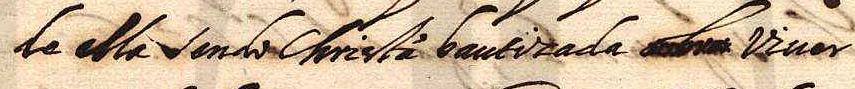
de ella sendo Christã bautizada _____ viuer
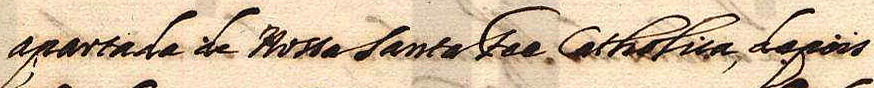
apartada de nossa santa Fee Catholica, depois
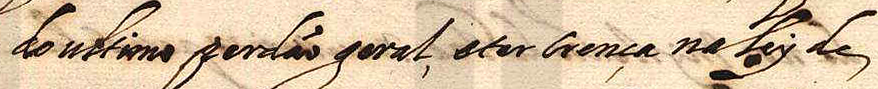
do ultimo perdaõ geral, e ter crença na Ley de
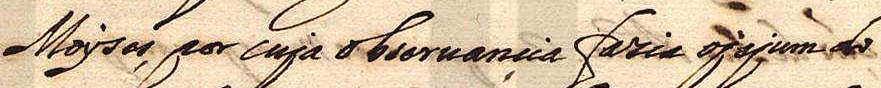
Moyses, por cuja obseruançia fazia o jejum do
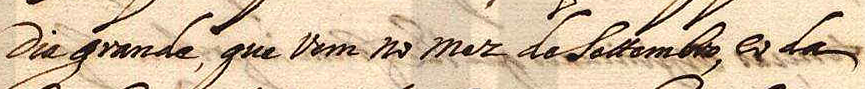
dia grande, que vem no mez de Settembro, e o da
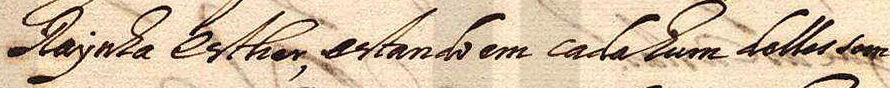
Raynha esther, estando em cada hum delles sem
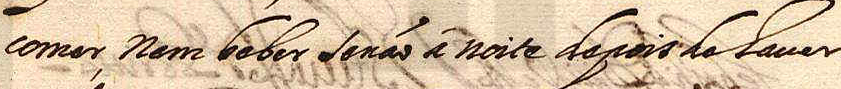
comer, nem beber senaõ á noite depois de hauer
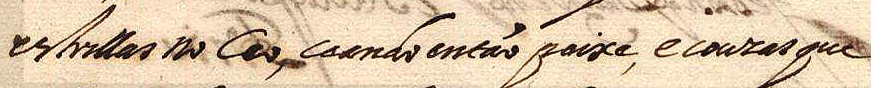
estrellas no Ceo, ceando entaõ peixe, e couzas que
